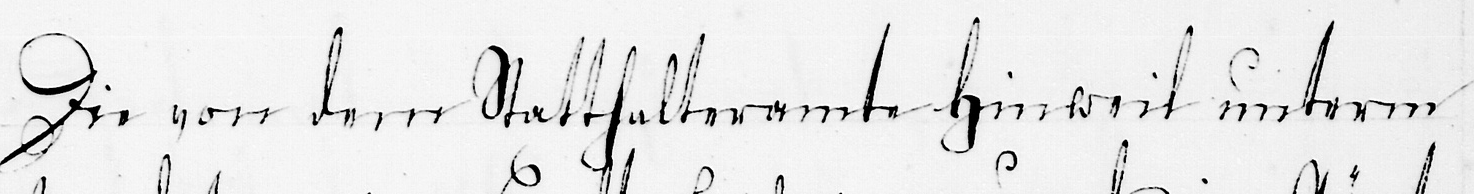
Die von dem Statthalteramte Hinweil unterm
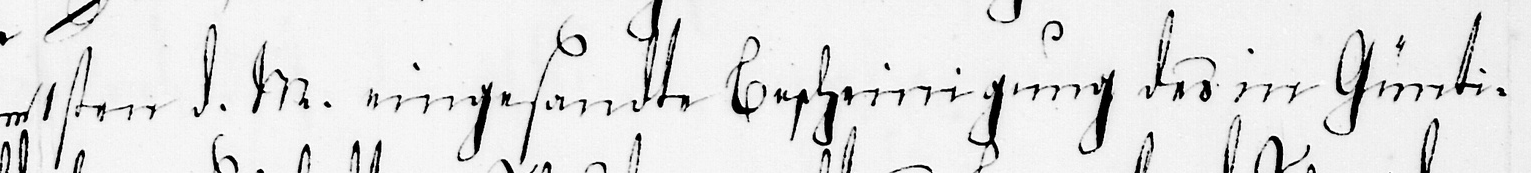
1sten d. M. eingesandte Bescheinigung des in Günti¬
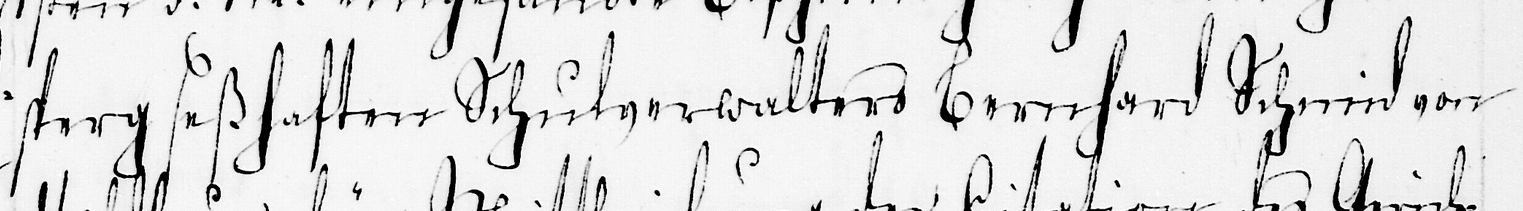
sperg seßhaften Schulverwalters Bernhard Schmid von
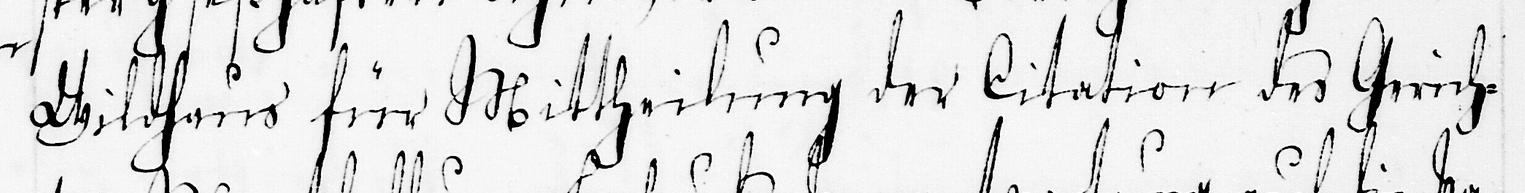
Wildhaus für Mittheilung der Citation des Gerich¬
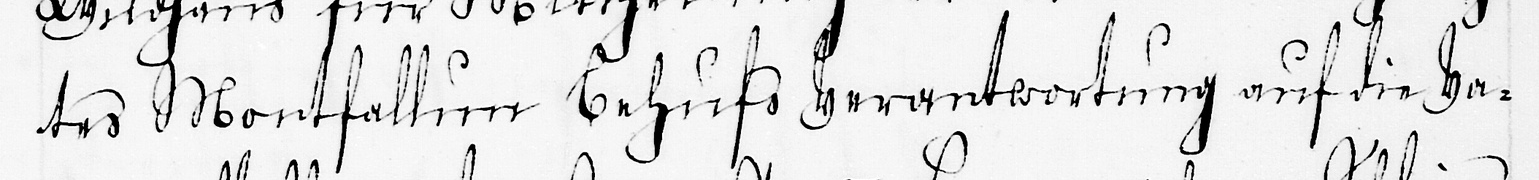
tes Montfallun Behufs Verantwortung auf die Va¬
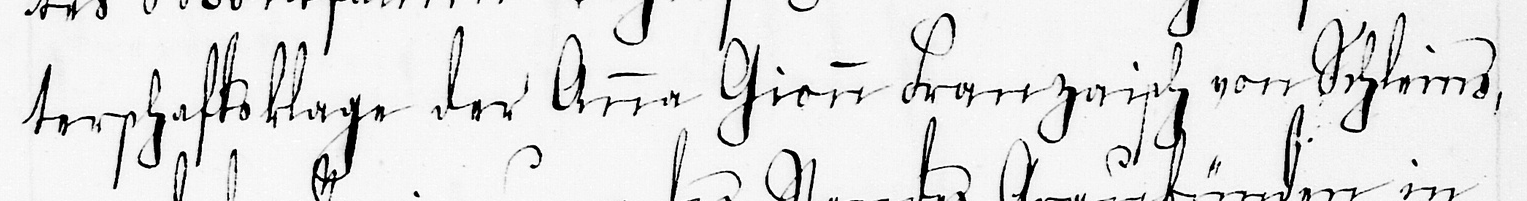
terschaftsklage der Anna Gionn Franzaisch von Schleins,
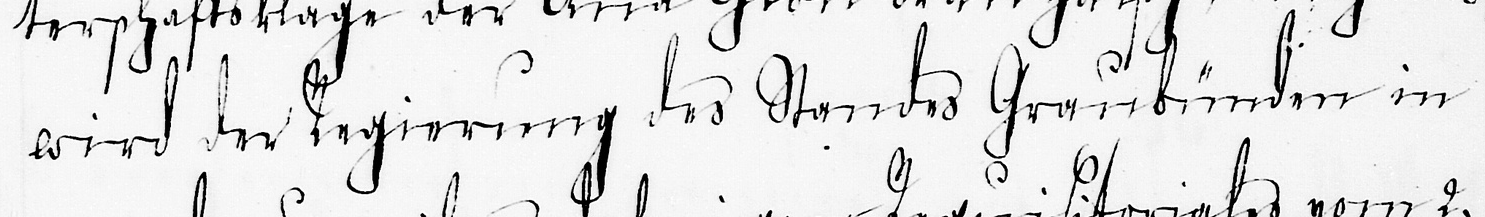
wird der Regierung des Standes Graubünden in
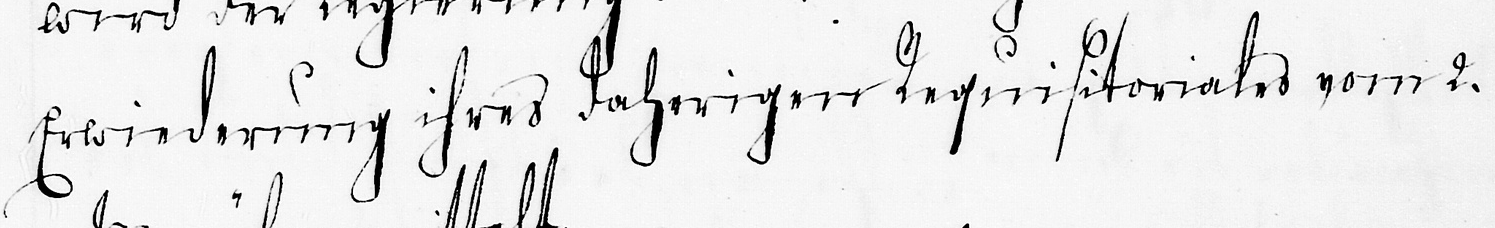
Erwiederung ihres daherigen Requisitoriales vom 2.
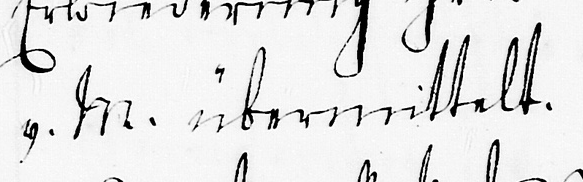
v. M. übermittelt.
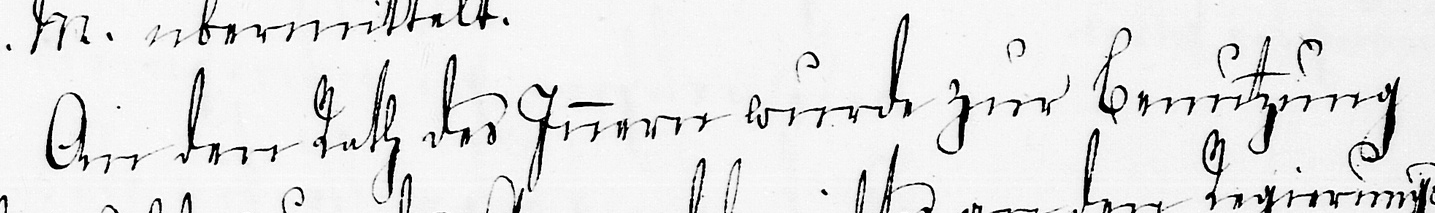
An den Rath des Innern wurde zur Benutzung
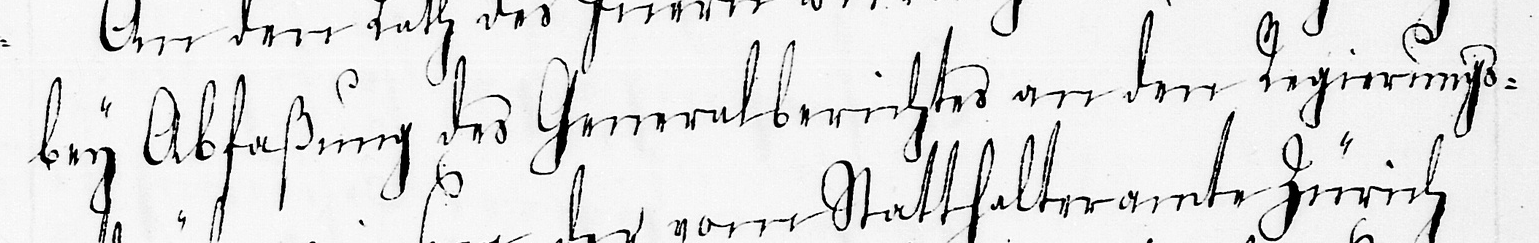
bey Abfaßung des Generalberichtes an den Regierungs¬
